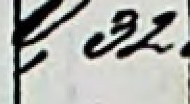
0,32
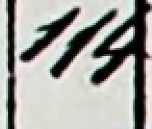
114
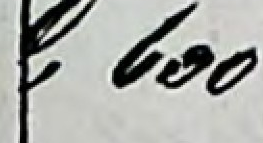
0,630
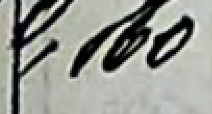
0,160
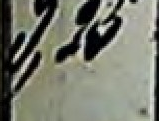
3,25
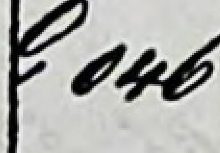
0,046
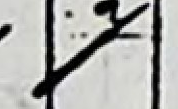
7
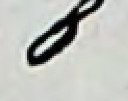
8
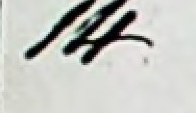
14
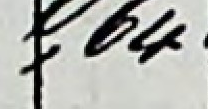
0,64
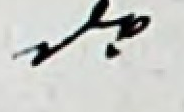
do
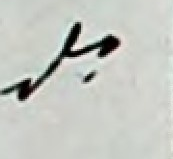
do
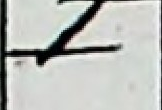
I
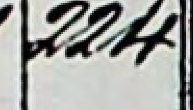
224
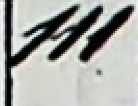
111
